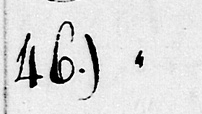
46.) “
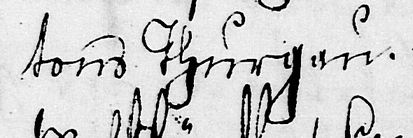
tons Thurgau.
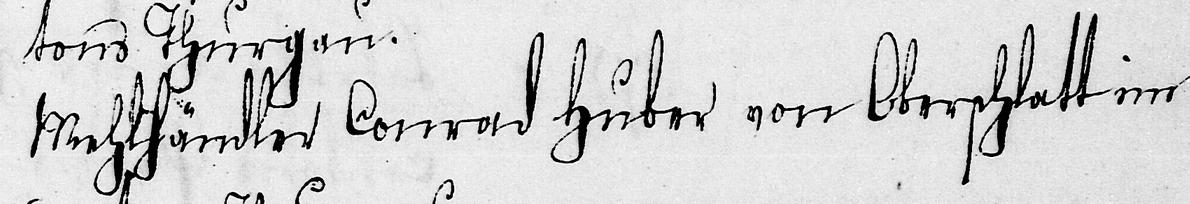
Mehlhändler Conrad Huber von Oberschlatt im
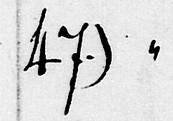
47.)
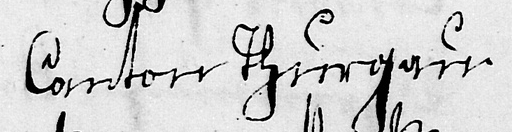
Canton Thurgau.
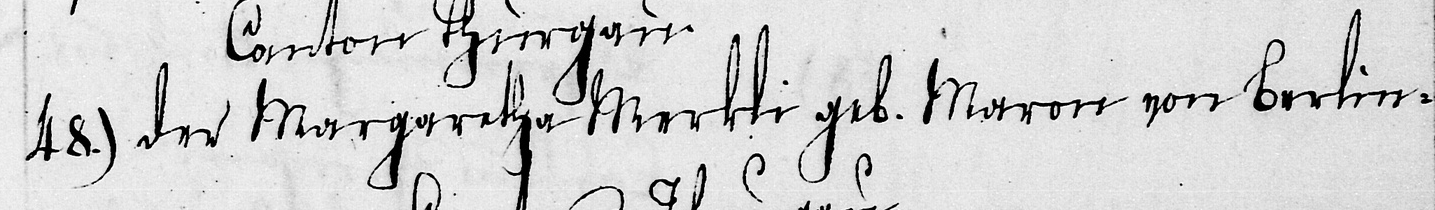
48.) der Margaretha Merkli geb. Maron von Berlin¬
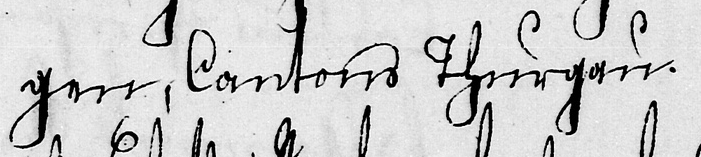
gen, Cantons Thurgau.
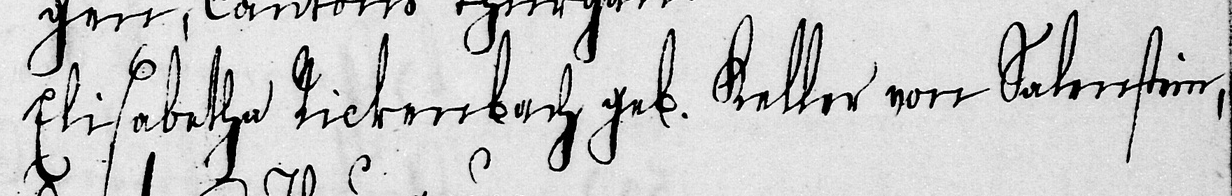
Elisabetha Rickenbach geb. Keller von Salenstein,
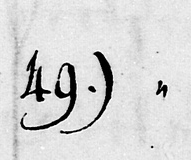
49.) “
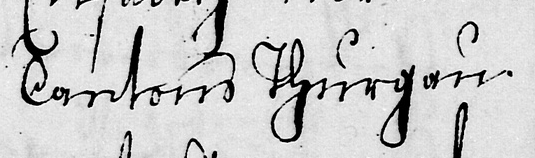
Cantons Thurgau.
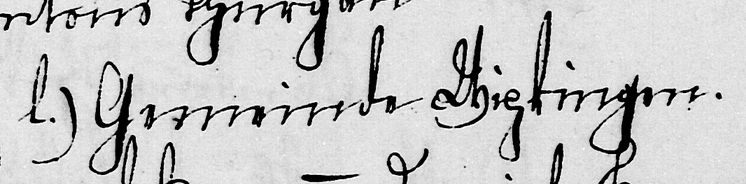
l.) Gemeinde Wipkingen.
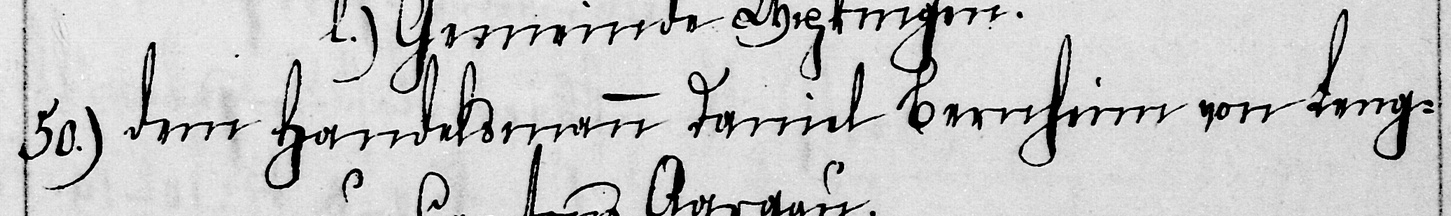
50.) Dem Handelsmann Daniel Bernheim von Lang¬
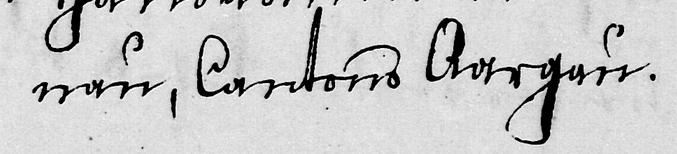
nau, Cantons Aargau.
